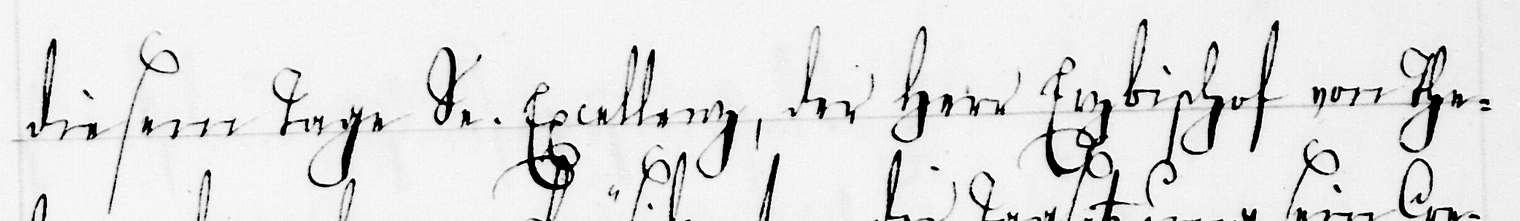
diesem Tage Se. Excellenz, der Herr Erzbischof von The¬
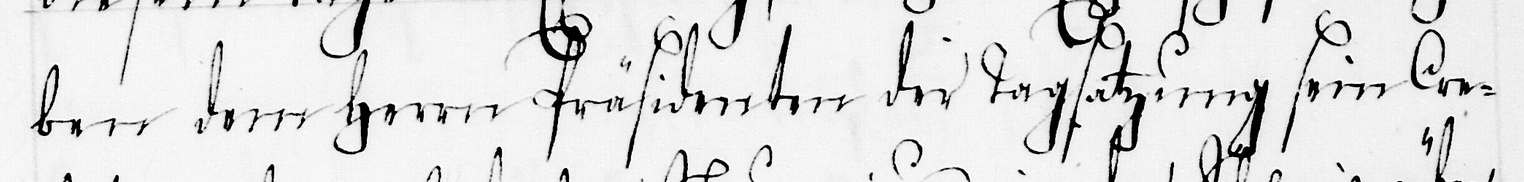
ben dem Herrn Präsidenten der Tagsatzung sein Cre¬
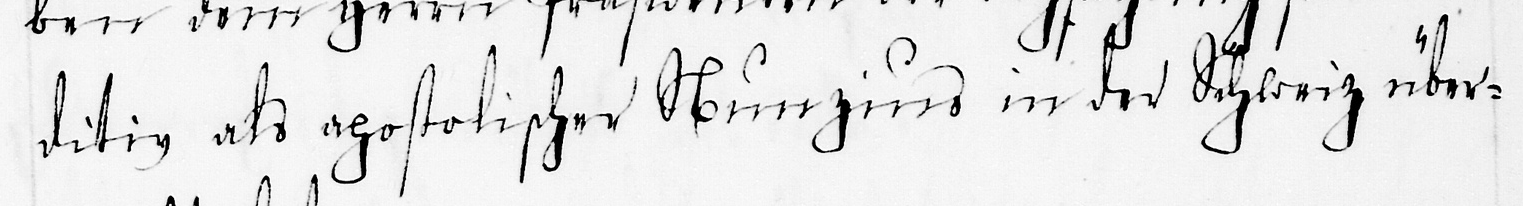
ditiv als apostolischer Nunzius in der Schweiz über¬
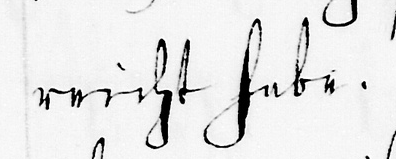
reicht habe.
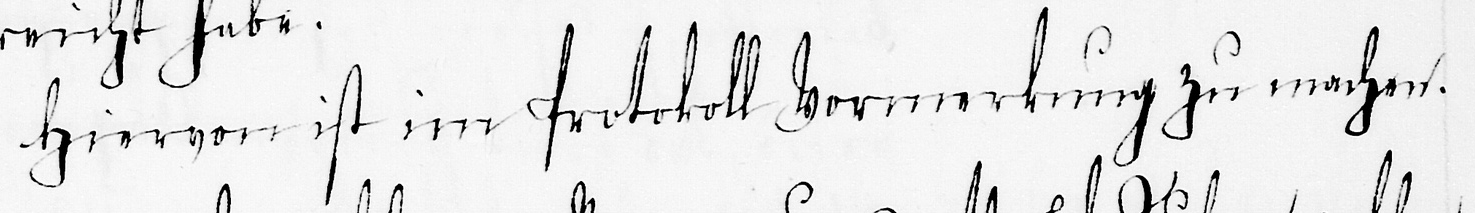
Hiervon ist im Protokoll Vormerkung zu machen.
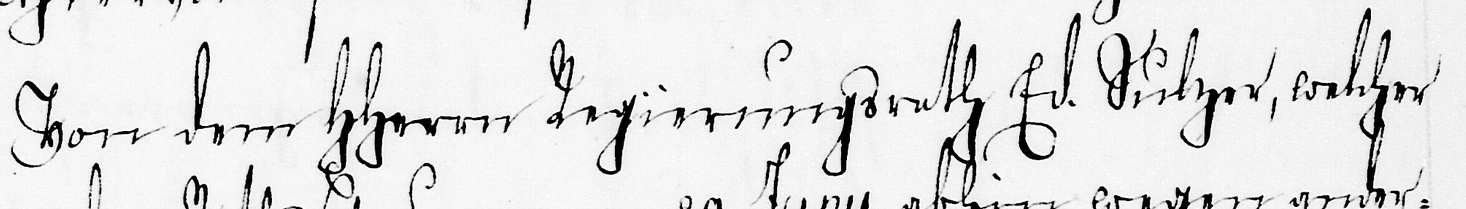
Von dem HHerrn Regierungsrath Ed. Sulzer, welcher
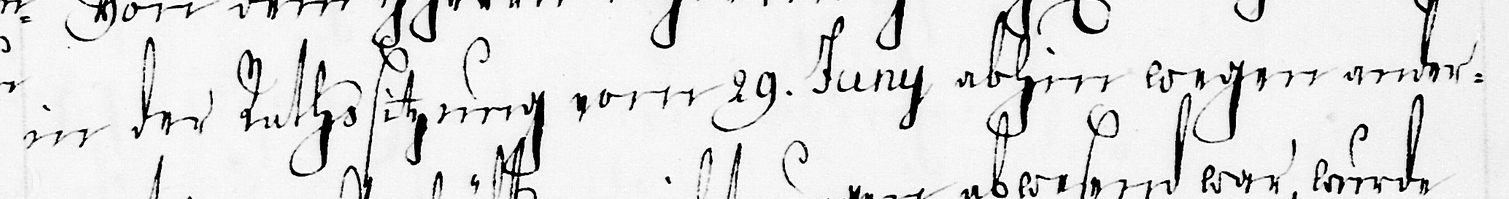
in der Rathssitzung vom 29. Juny abhin wegen ander¬
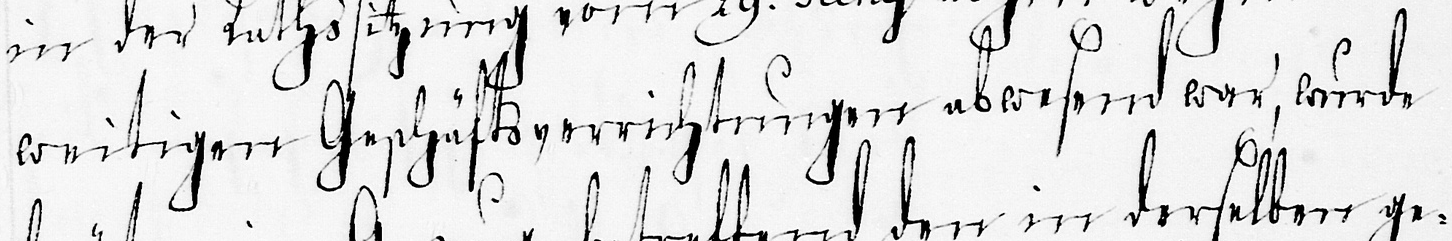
weitigen Geschäftsverrichtungen abwesend war, wurde
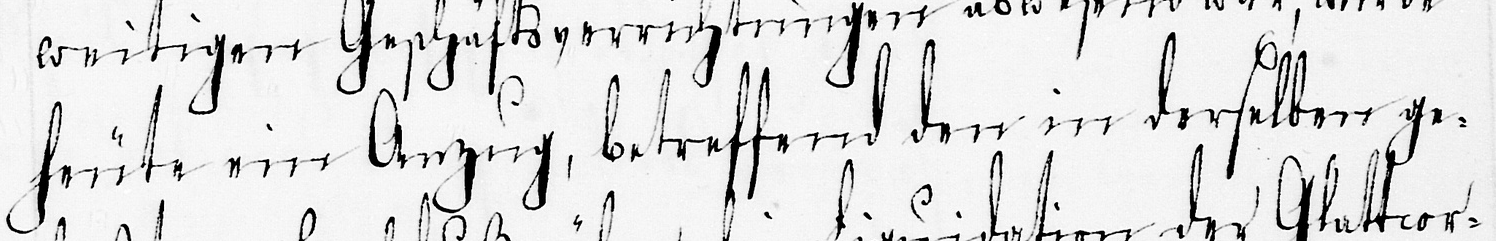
heute ein Anzug, betreffend den in derselben ge¬
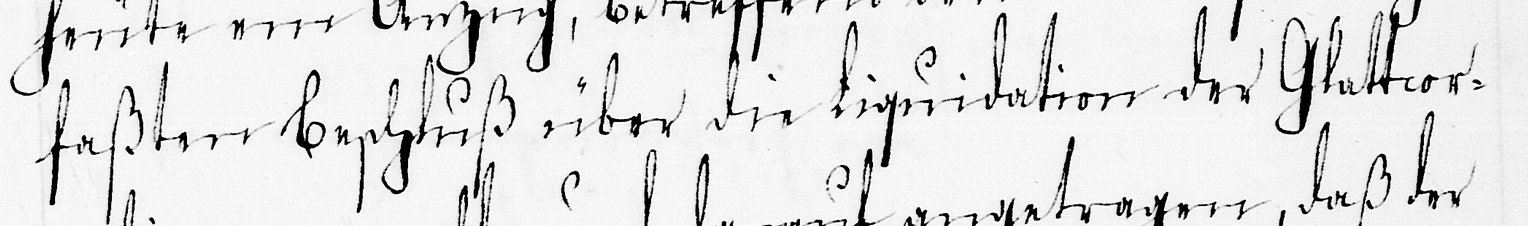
faßten Beschluß über die Liquidation der Glattcor¬
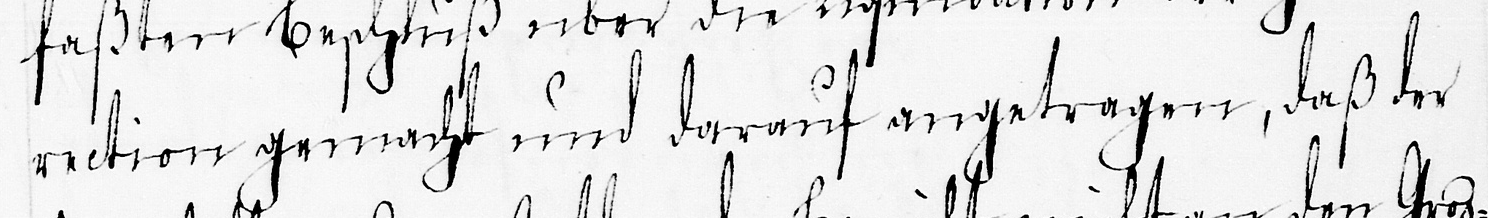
rection gemacht und darauf angetragen, daß der
